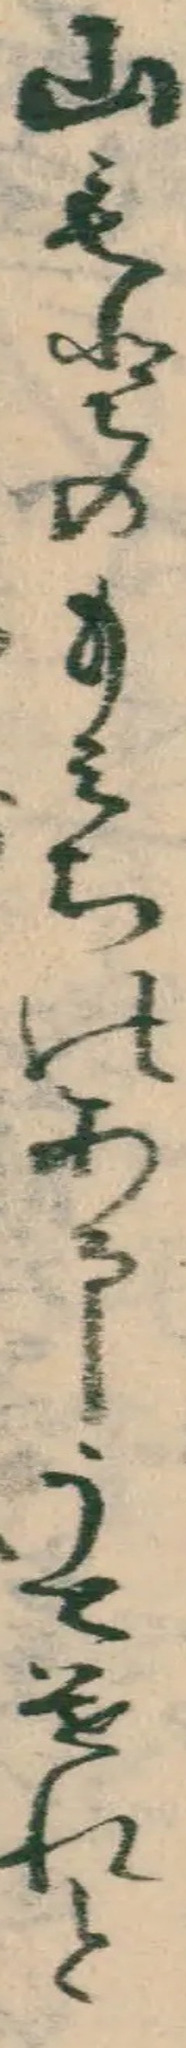山もとのもみちのあるしうとけれと
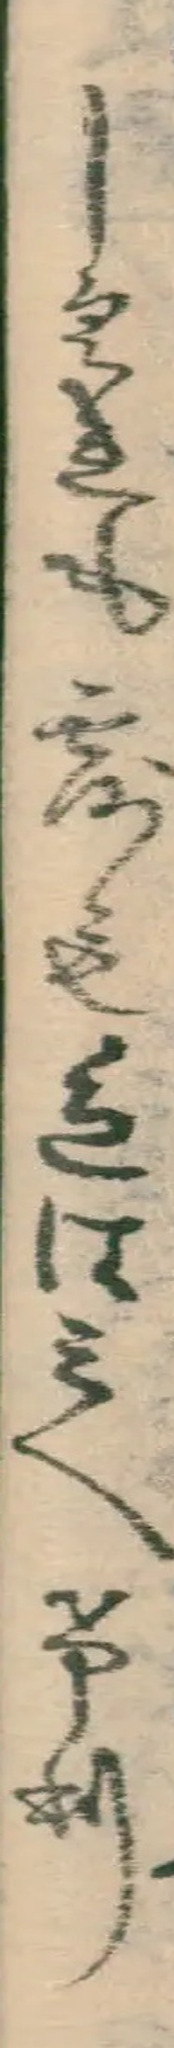しくれも露も色はみへけり
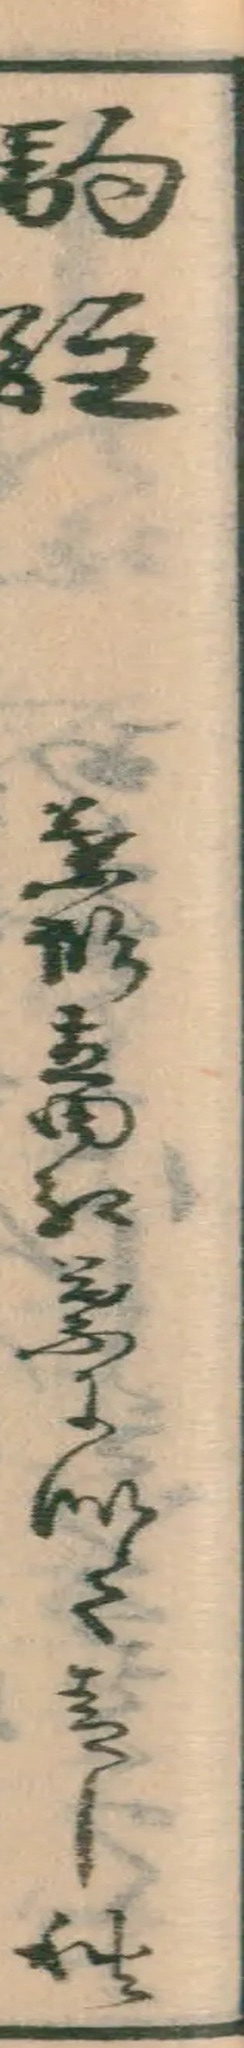駒駐葉形立田紅葉に似て青し秋
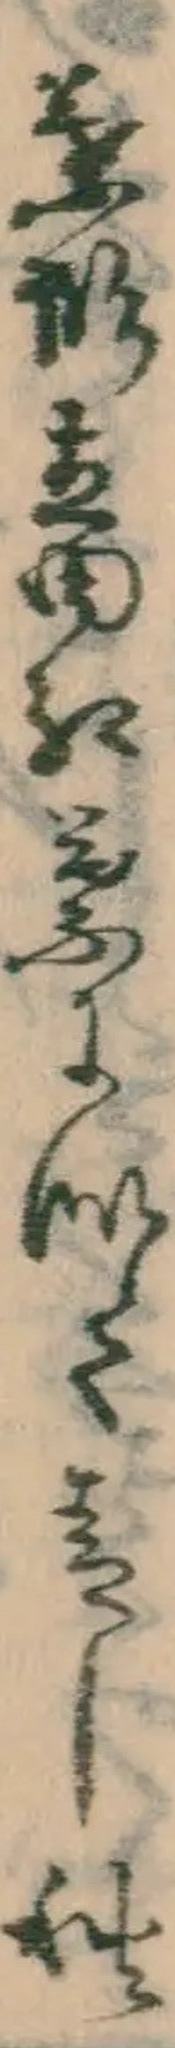駒駐葉形立田紅葉に似て青し秋
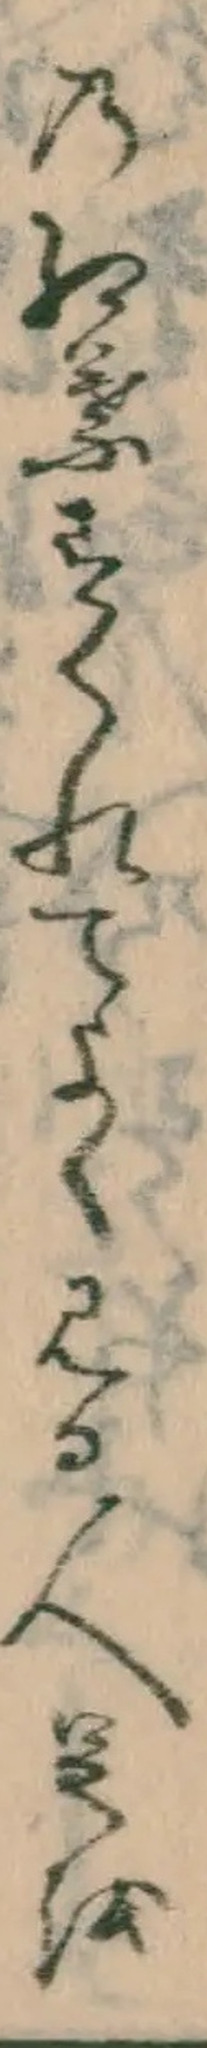の紅葉すくれてよく見る人足を
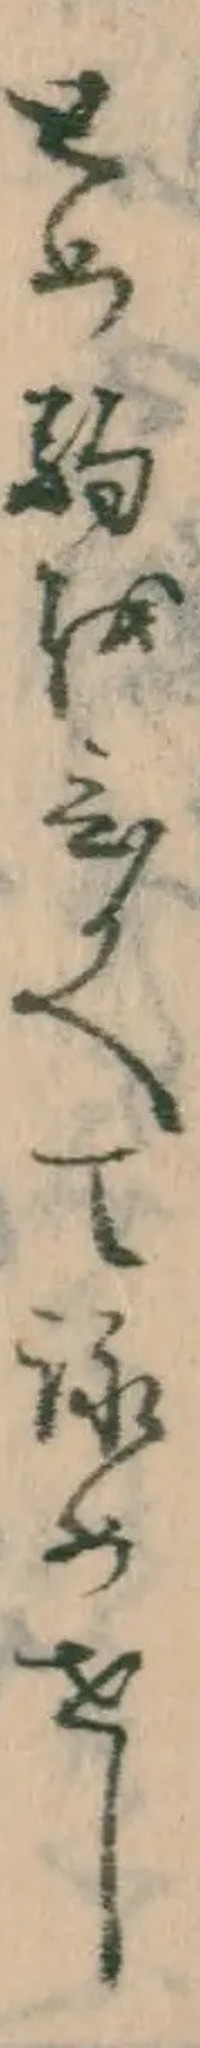とめ駒をひかへて詠めせし
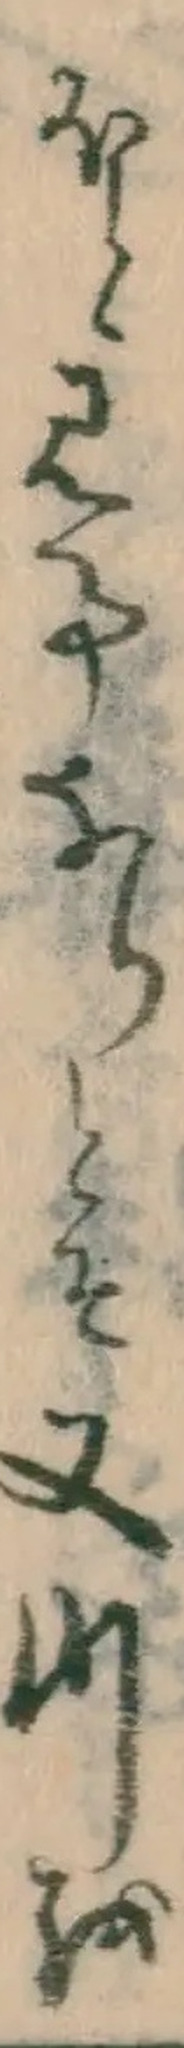ほと見事なりとそ又川を
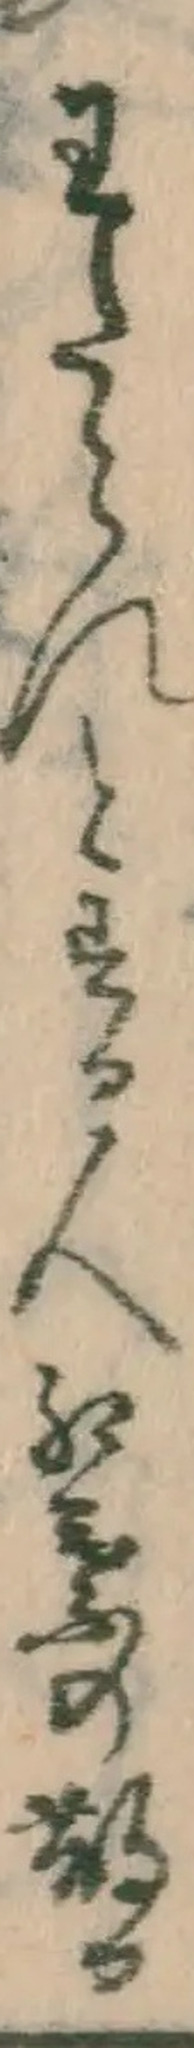わたらんとする人紅葉の散る
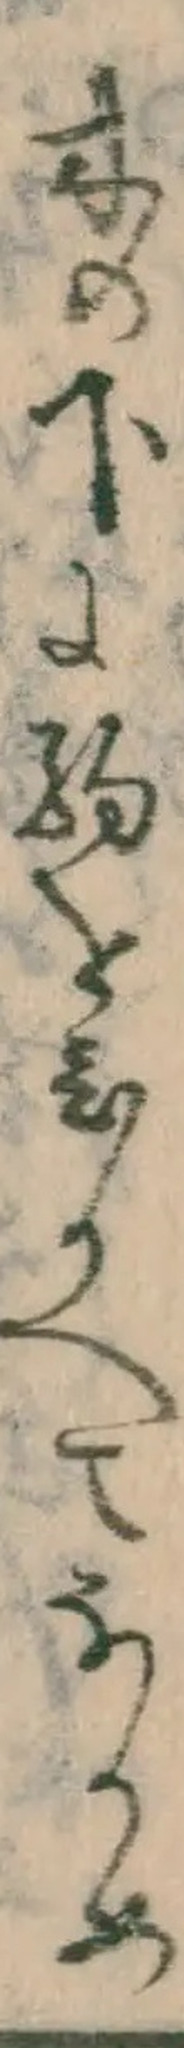木の下に駒をひかへてなかめ
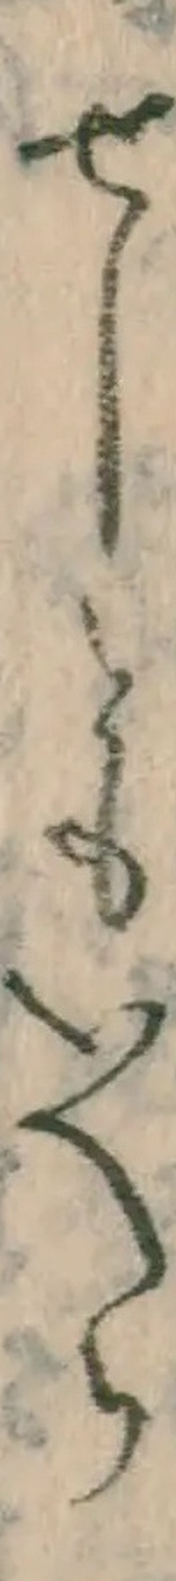せしともいへり
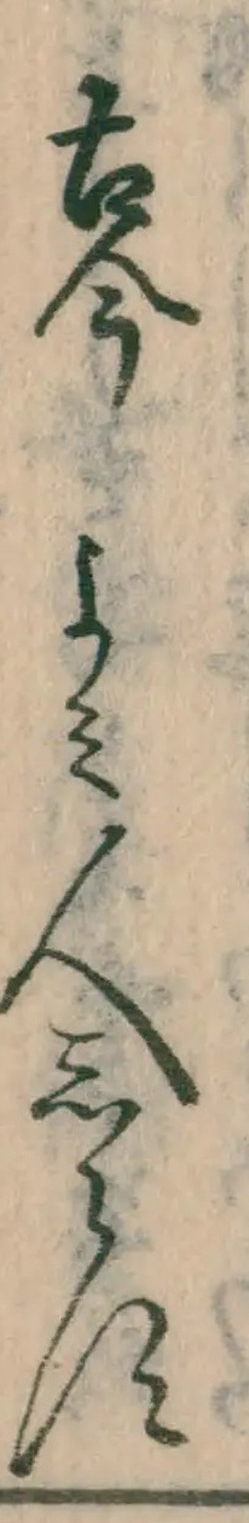古今よみ人しらす
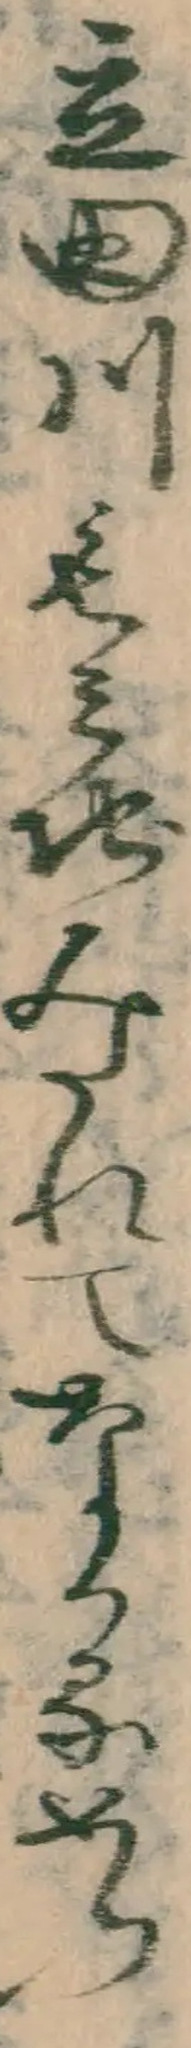立田川もみちみたれてなかるめり
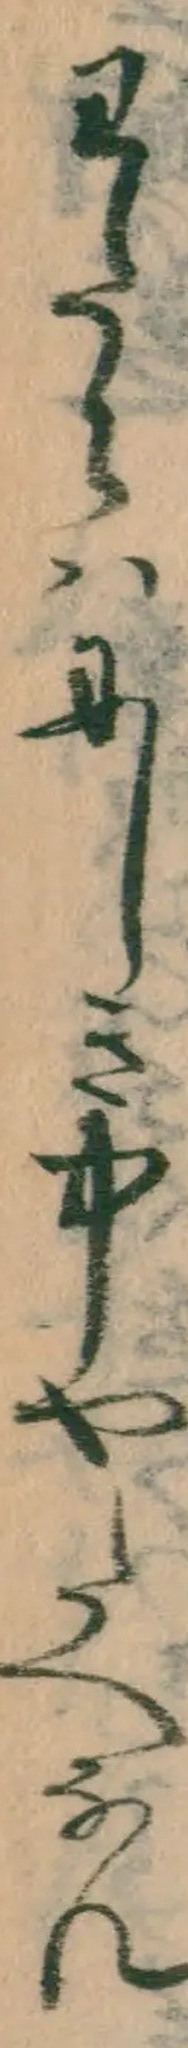わたらはにしき中やたへなん

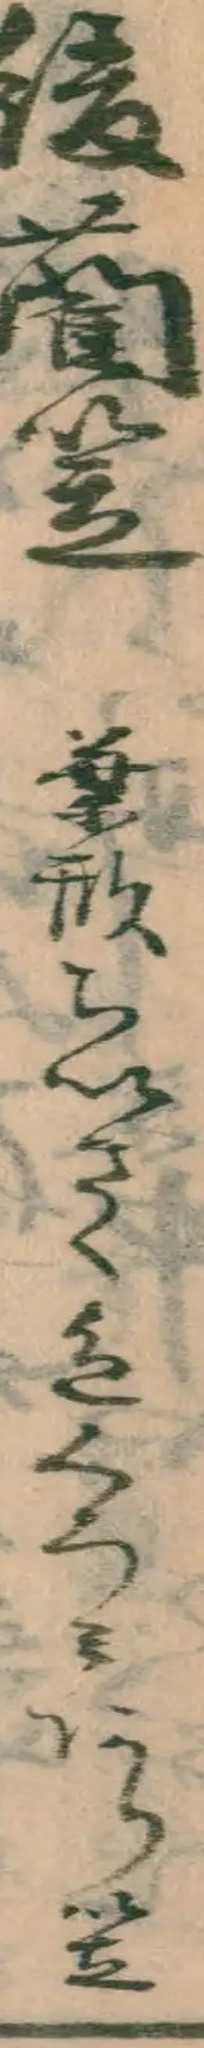綾藺笠葉形小さく色くろみあり笠
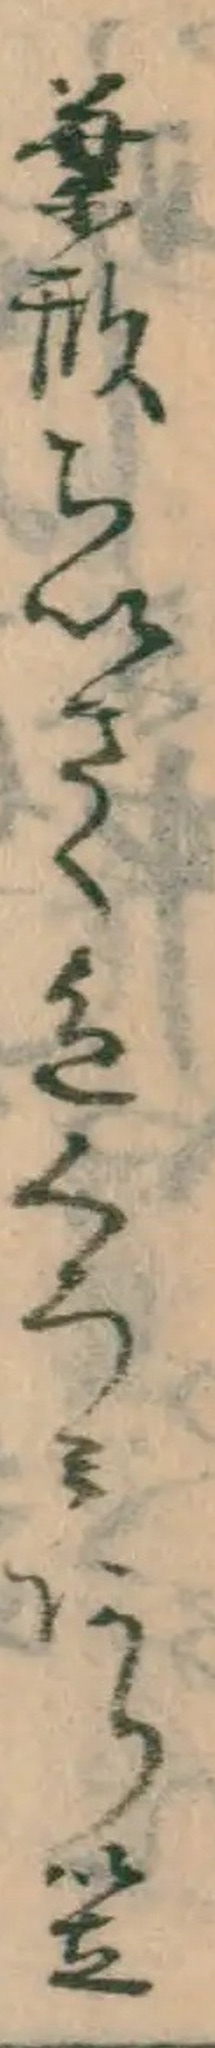綾藺笠葉形小さく色くろみあり笠
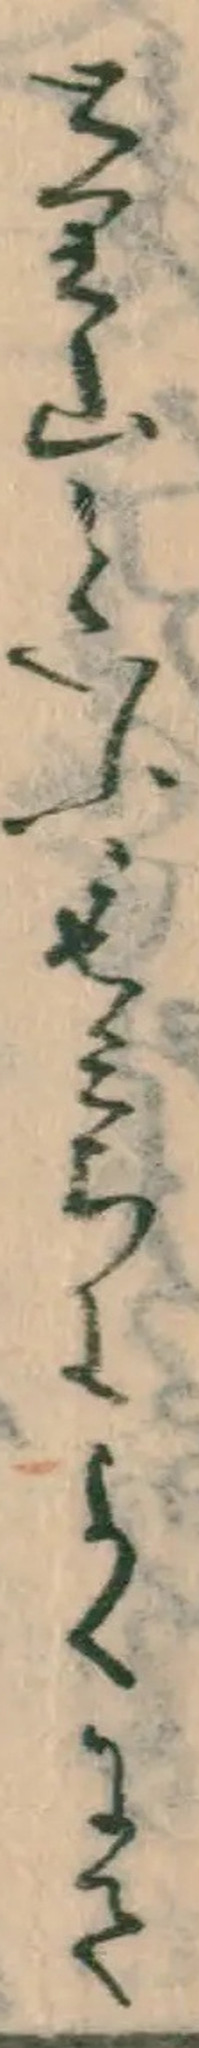とり山といふもみちによくにて
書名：紅葉集
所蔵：国立国会図書館 National Diet Library, JAPAN
